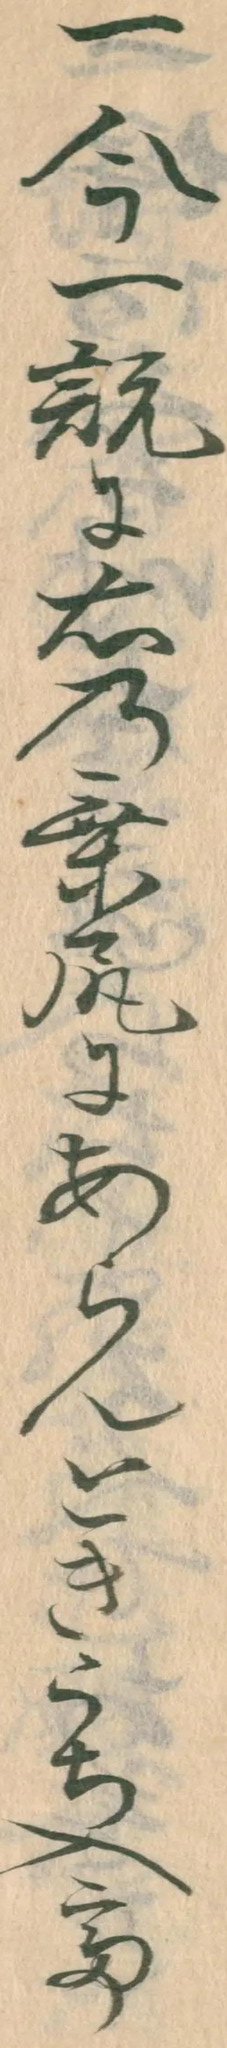一今一説に右の舞尻にあらんときうち入て
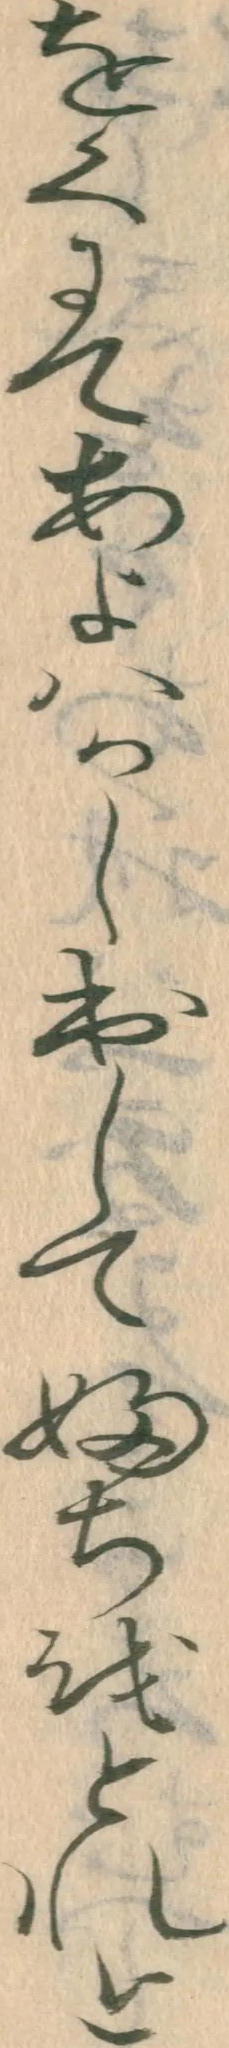をくにてあよはかし出してふちをとれと
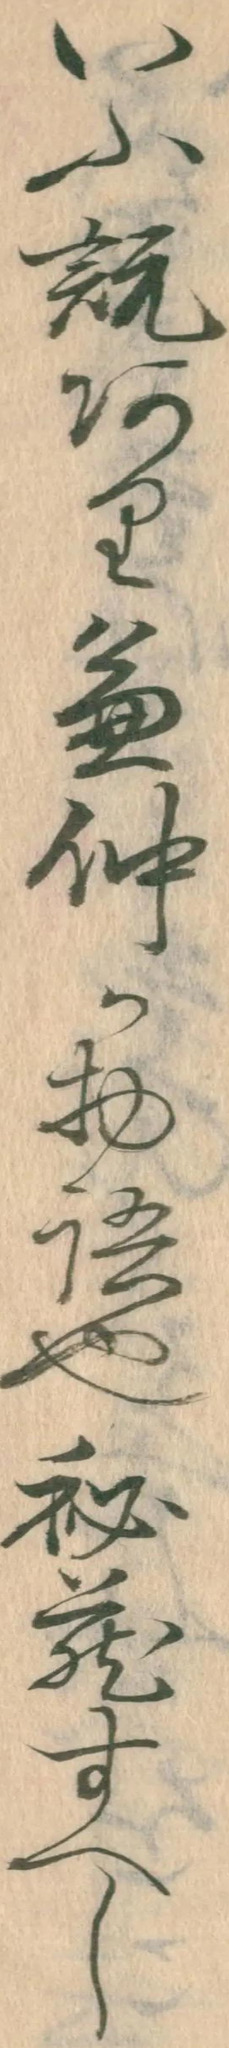いふ説あり兼仲か物語也秘蔵すへし
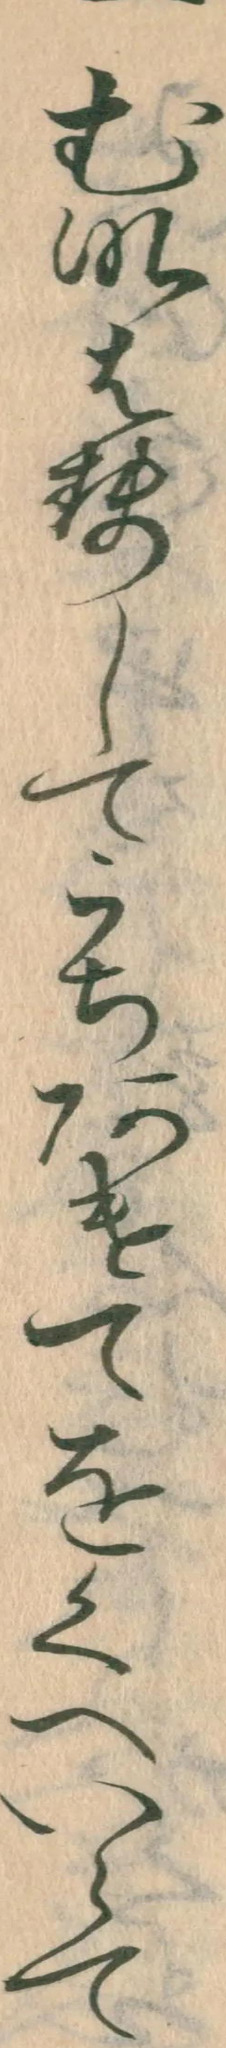一むなはせしてうちあけてをくへいらて
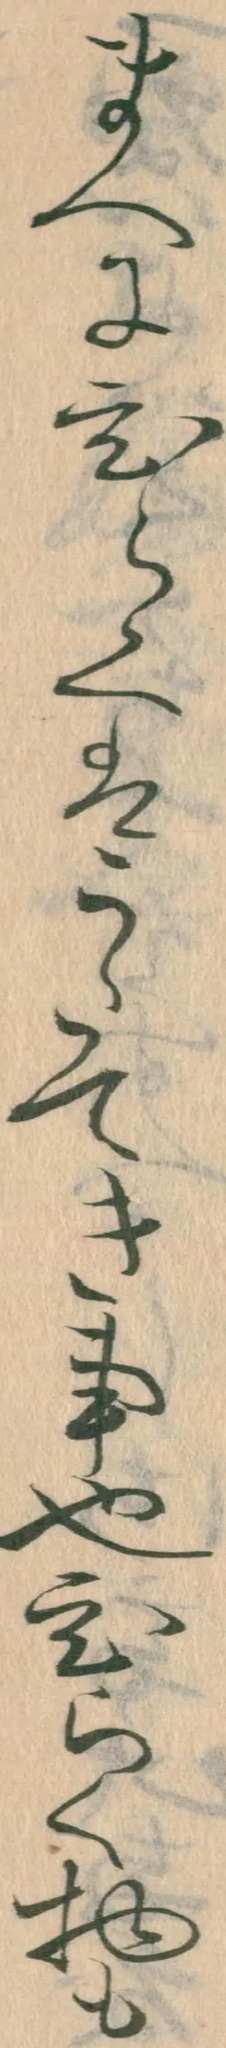まへにひらくはうたてき事也ひらく物も
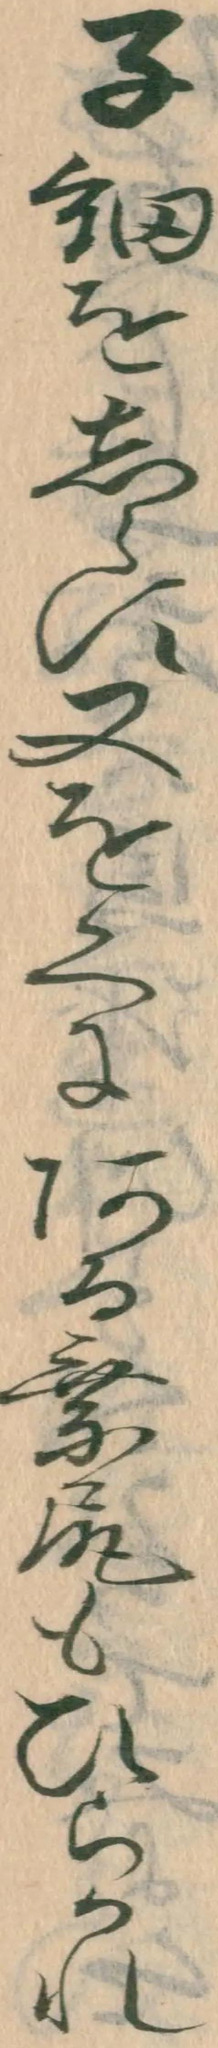子細をしらす又をくにある乗尻もひらかれ
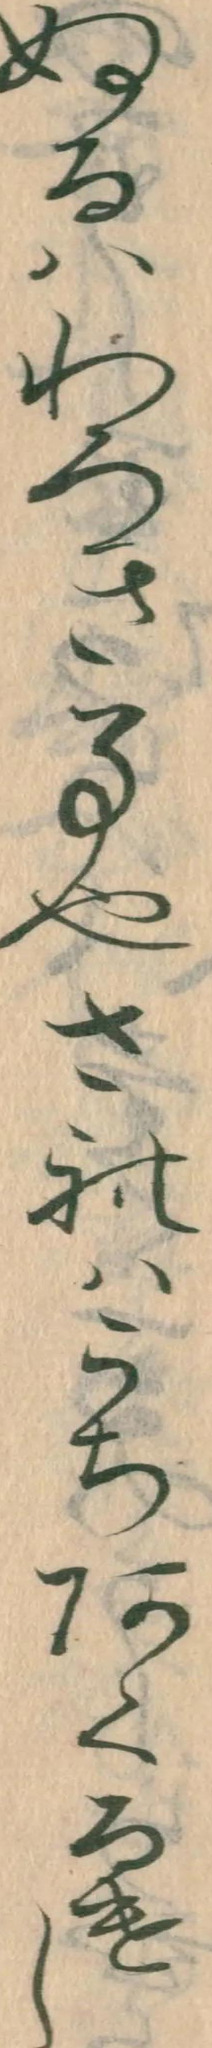ぬるはわろき事也されはうちあくるけし
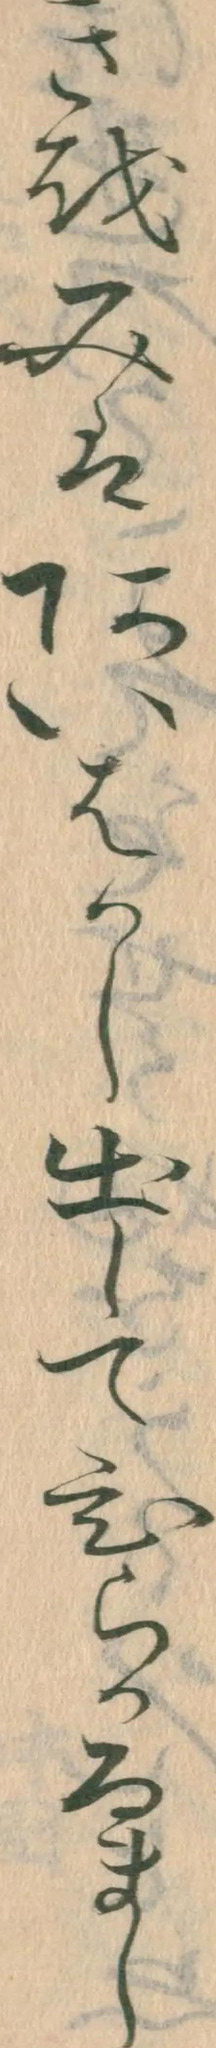きをみはあいはかし出してひらかるまし
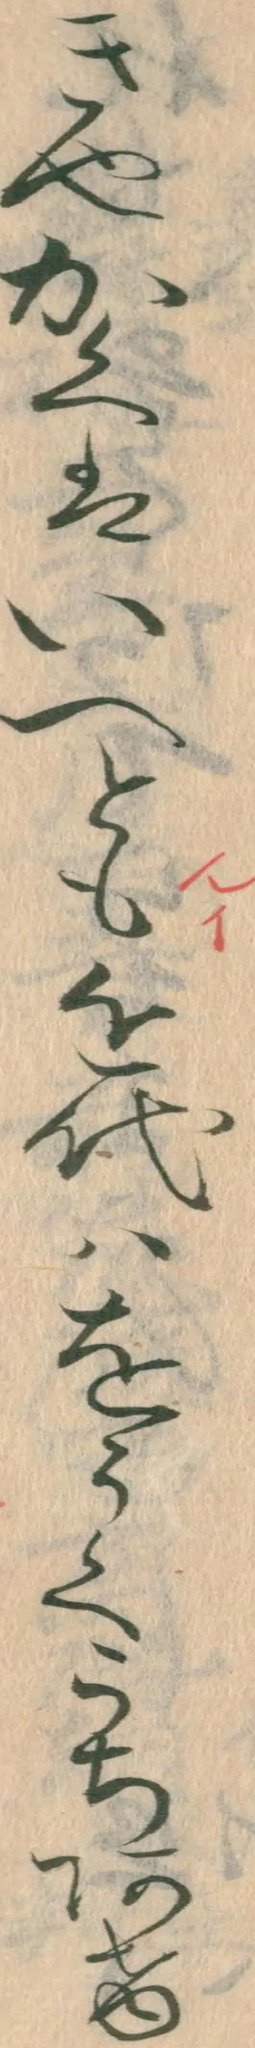き也かくはいへとも近代はをそくうちあけ
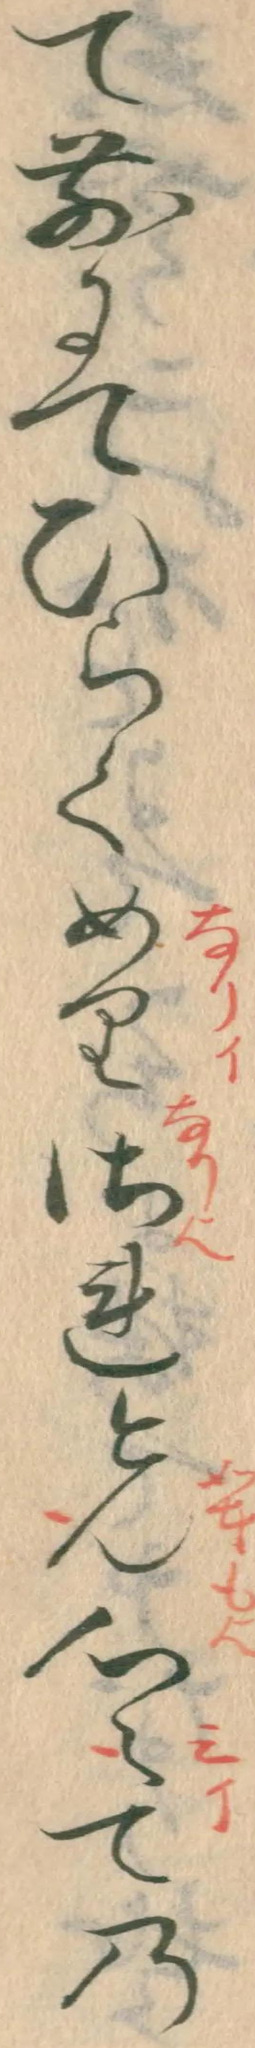て前にてひらくめりされとん心えての
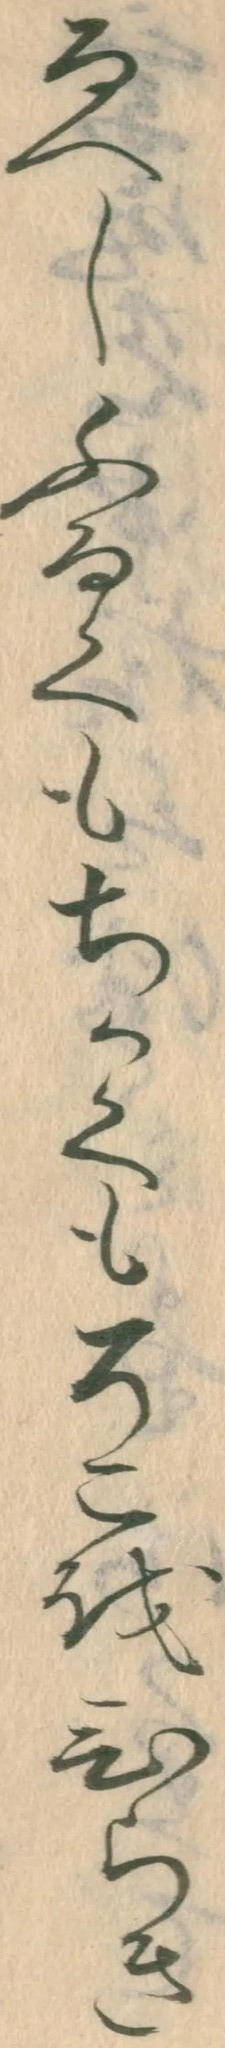るへしふるくもちかくもそこをひらき
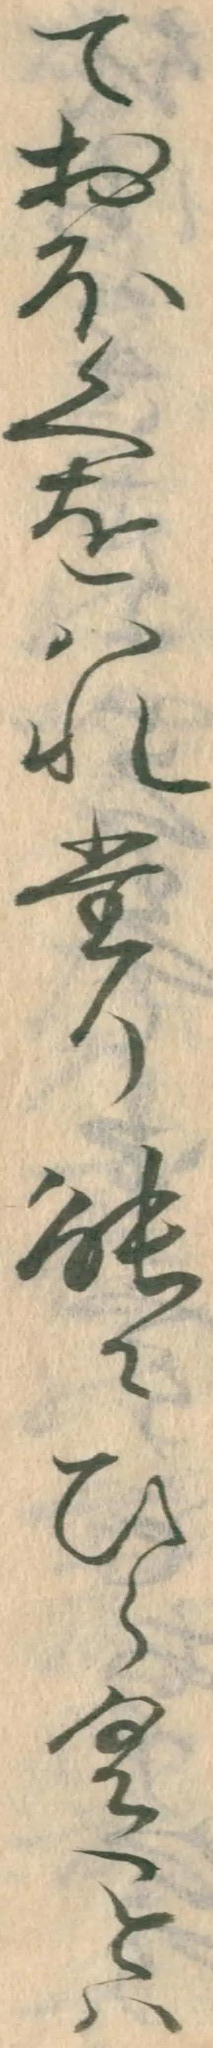ておほくをはれたり能々ひらくことは
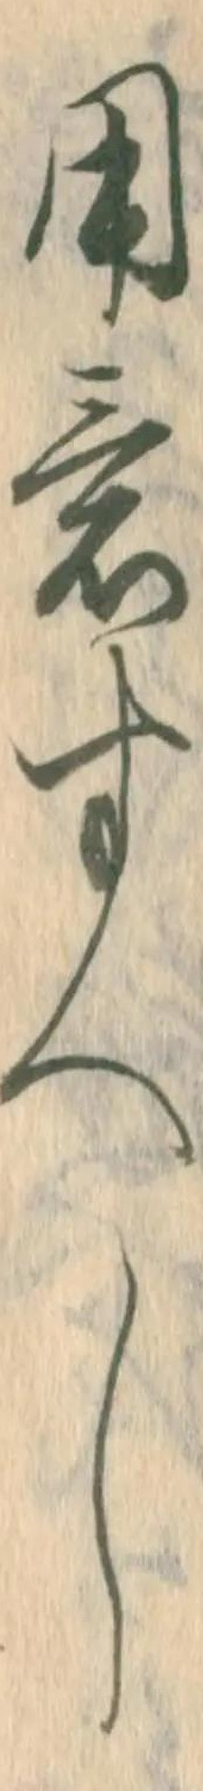用意すへし
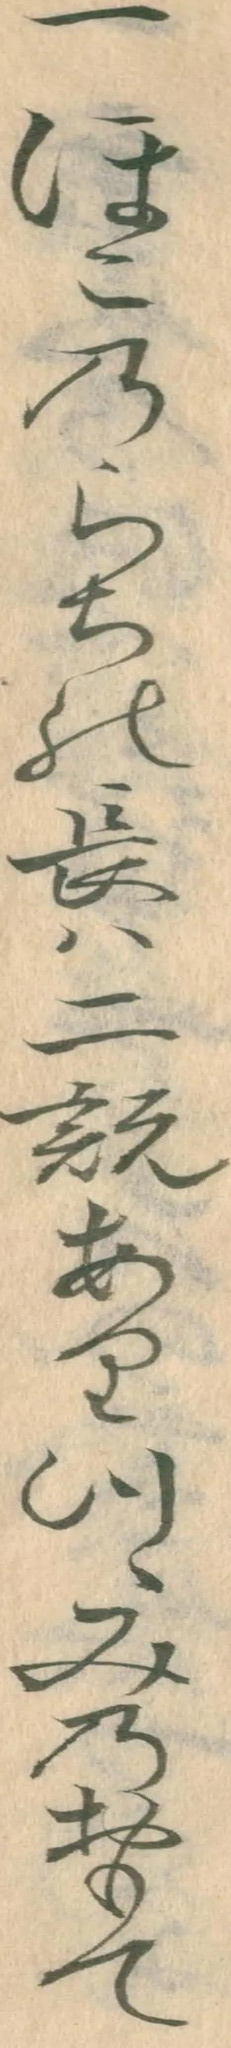一ほこのらちの長は二説ありつゝみのおもて
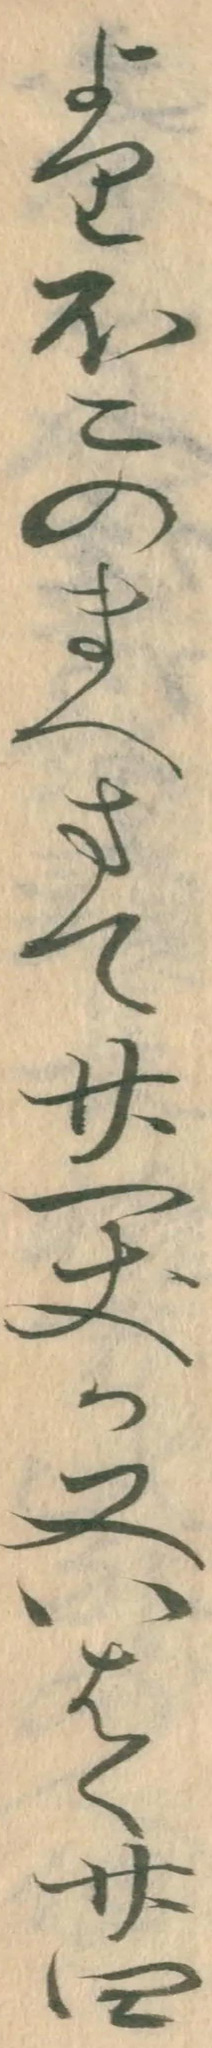よりほこのまへまて廿一丈か又いはく廿四

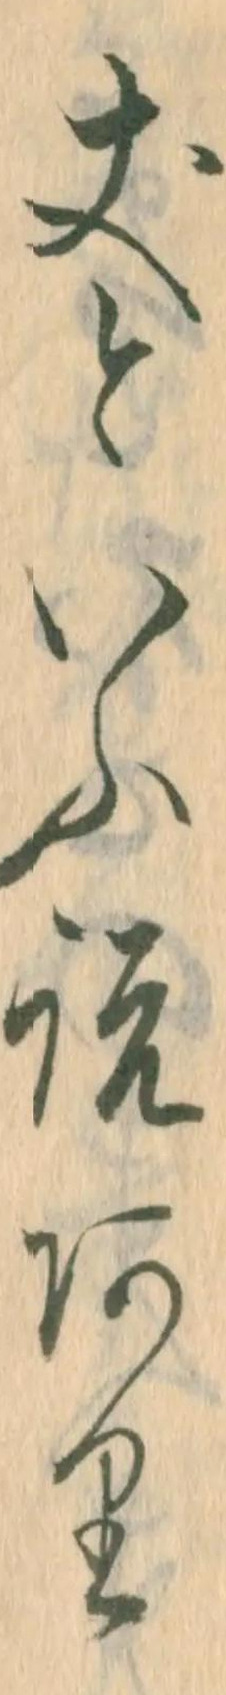丈といふ説あり
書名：賀茂社記録. 第13冊
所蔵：国立国会図書館 National Diet Library, JAPAN
